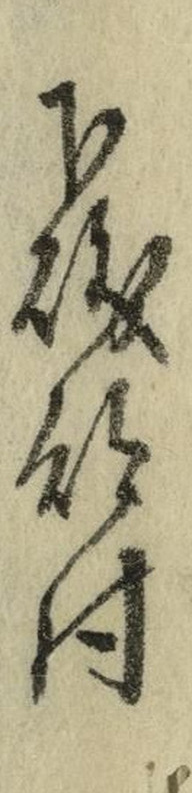下磯部村
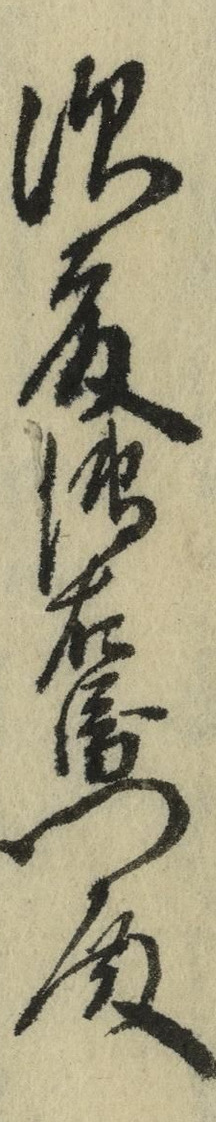須藤伝右衛門殿
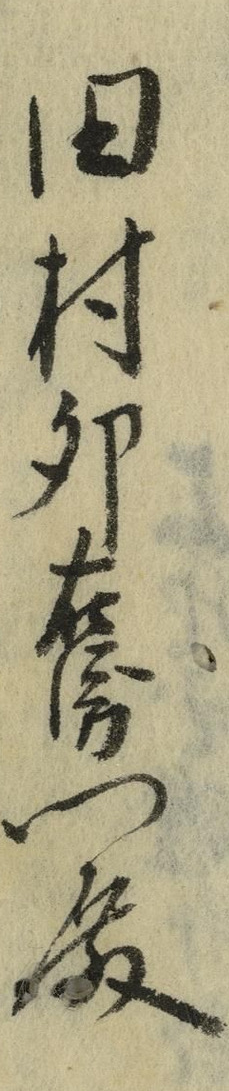田村卯右衛門殿
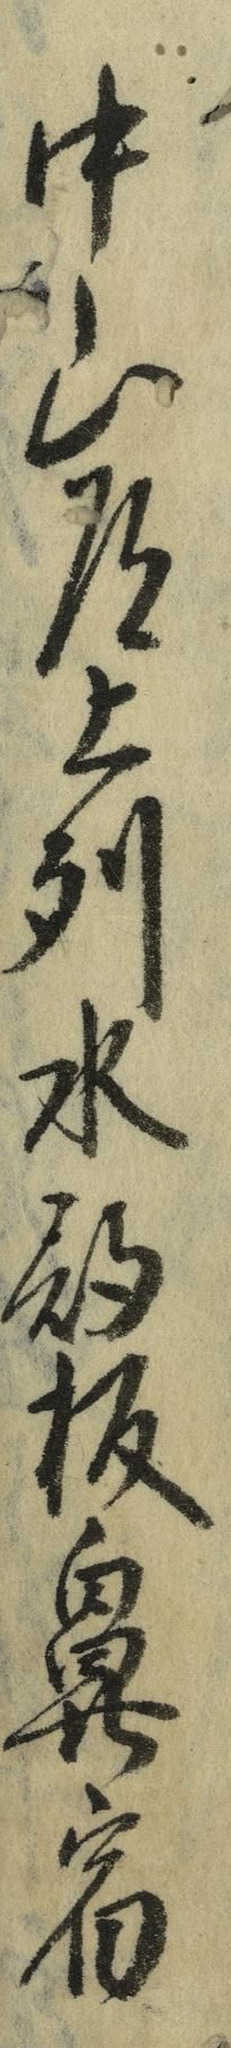中山道上州水殿板鼻宿
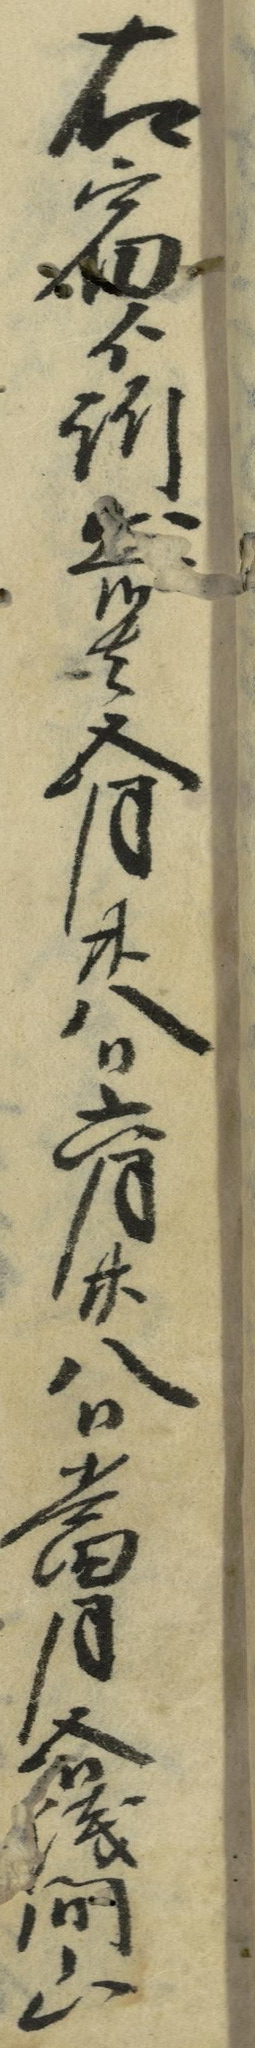右宿ゟ訴出候は五月廿八日六月廿八日当月五日浅間山
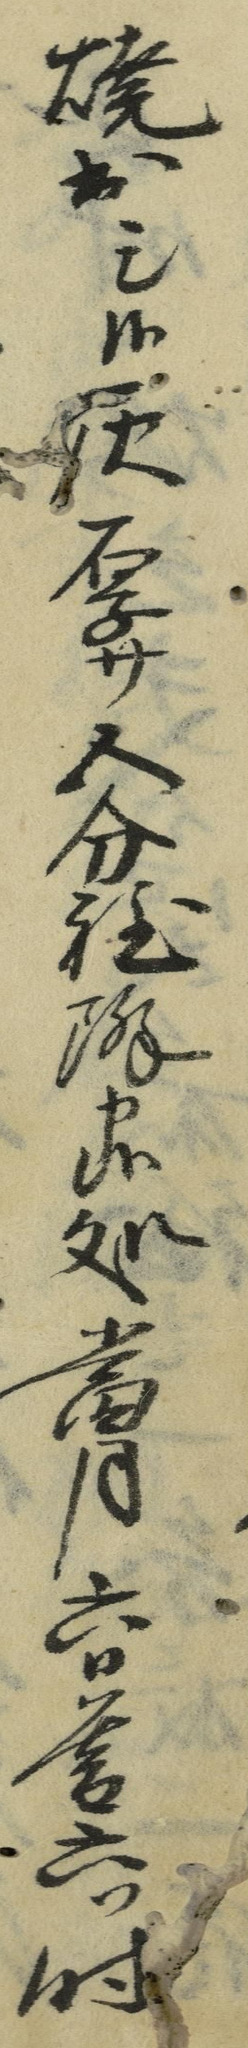焼出シ候灰厚サ五分程降申候処当月六日暮六ツ時
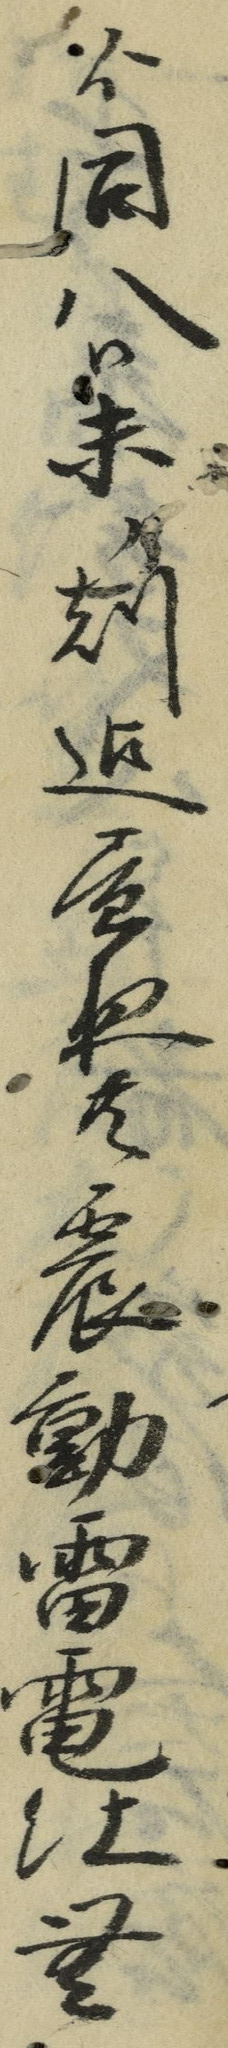ゟ同八日未ノ刻迄昼夜共震動雷電仕無
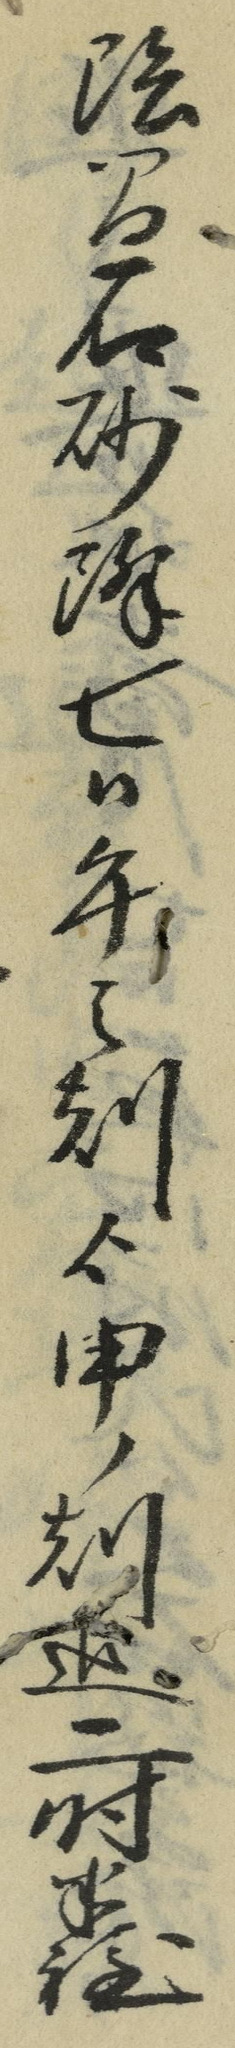陰間石砂降七日午之刻ゟ申ノ刻迄二時半程
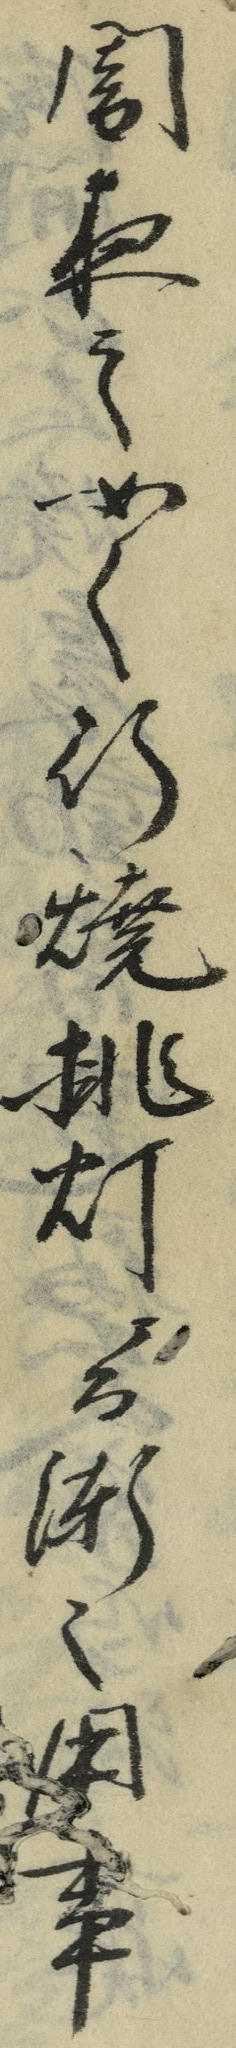闇夜之如く行燈挑灯に而漸く用事
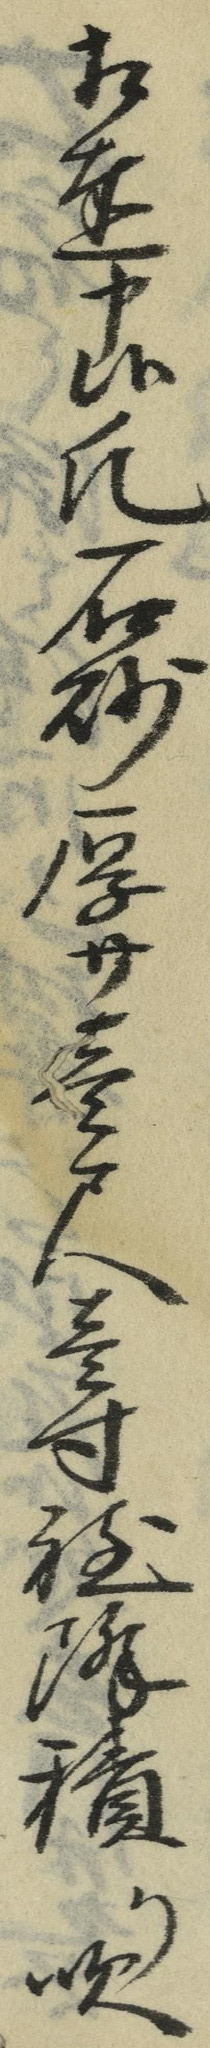相達申候凡石砂厚サ壱尺壱寸程降積り吹
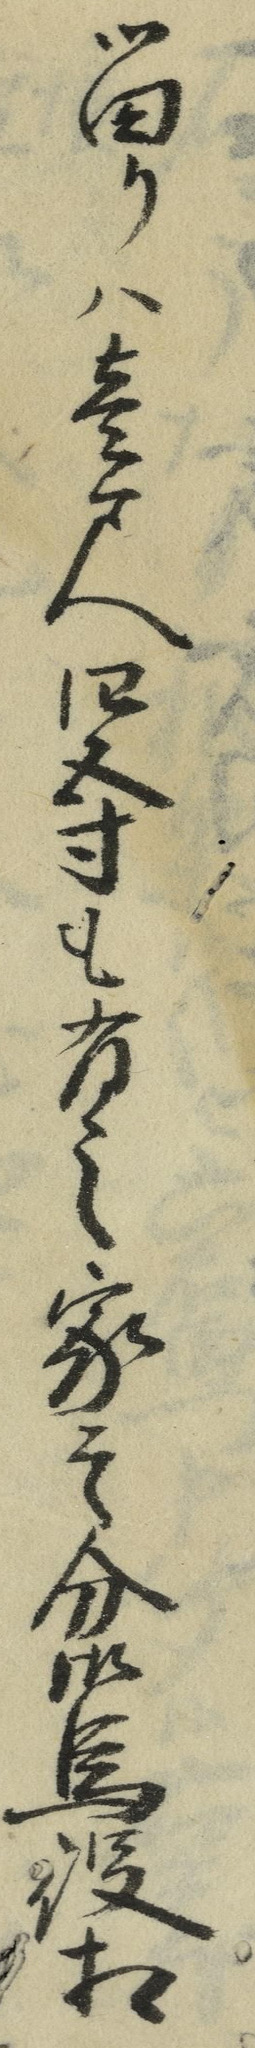留りは壱尺四五寸も有之家之分御馬役相
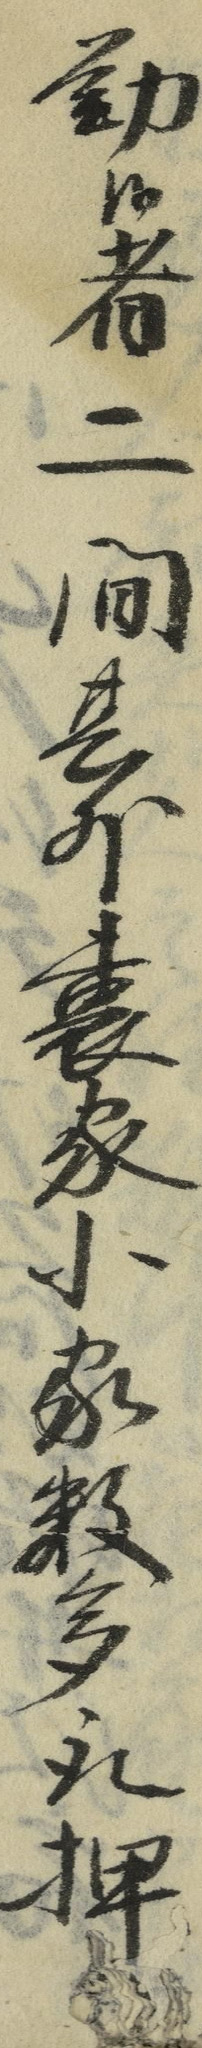勤候者二間其外裏家小家数多取押
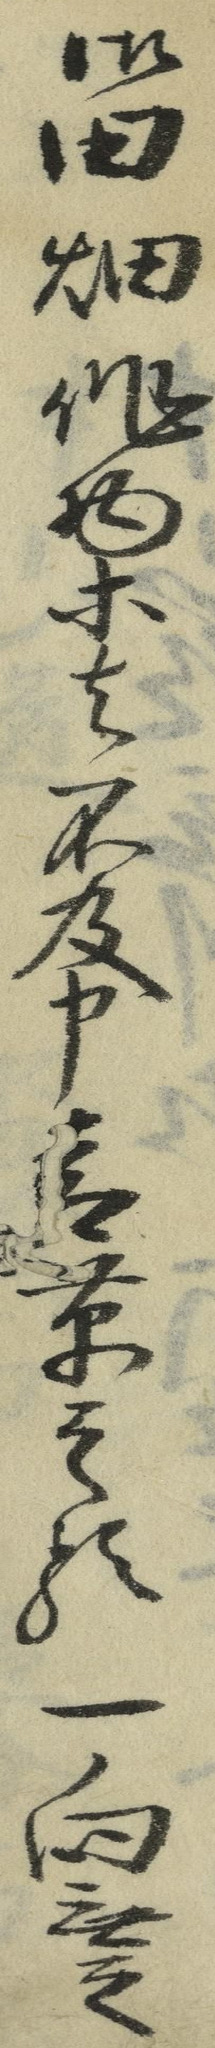御田畑作物等は不及申青草之類一向無之
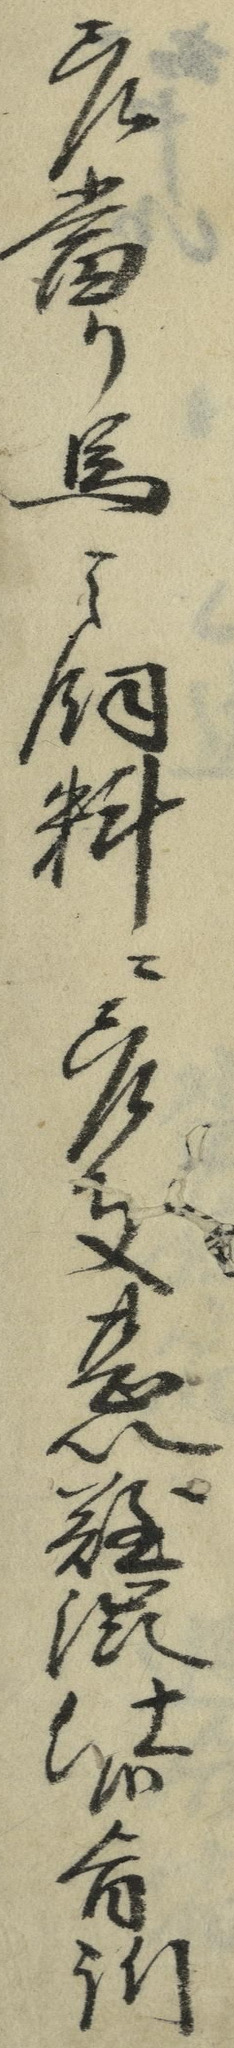差当り馬之飼料に差支甚以難渋仕候旨訴

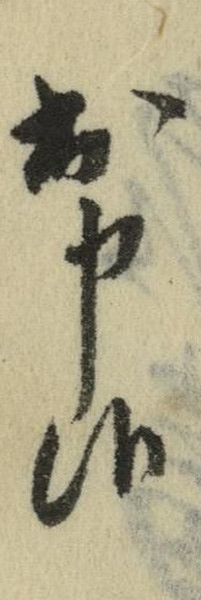出申候
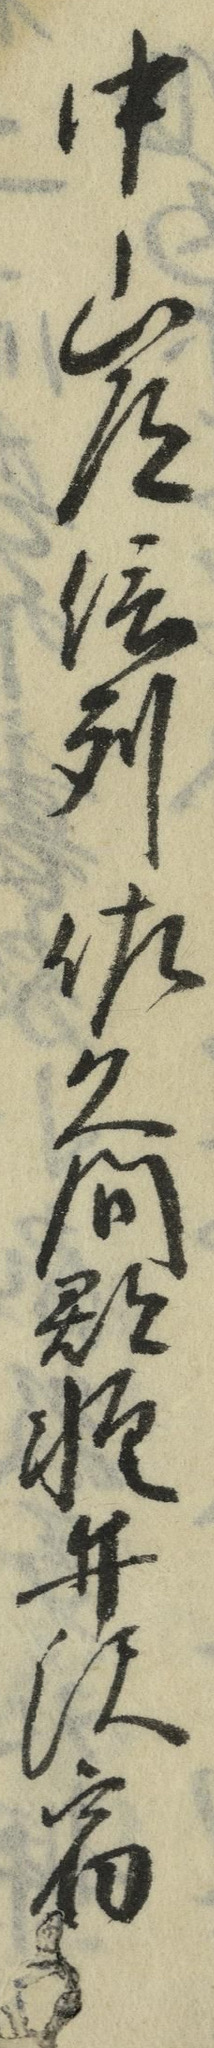中山道信州佐久問郡軽井沢宿
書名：天明三卯年七月　浅間山焼注進写
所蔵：東京大学地震研究所図書室 Earthquake Research Institute Library, The University of Tokyo, JAPAN
